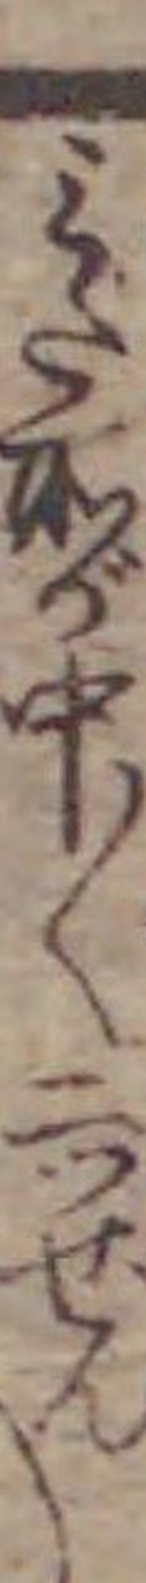みた所が中〳〵二つぜん
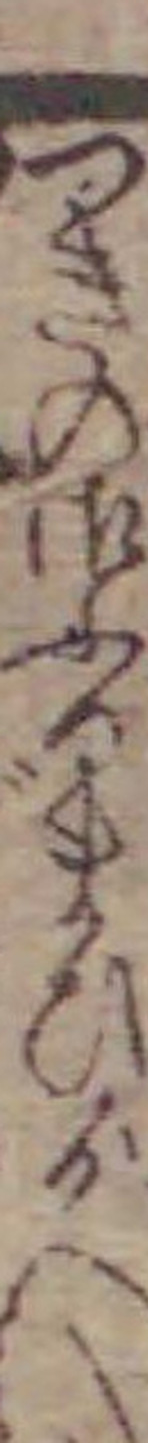つきの御ふるまひより
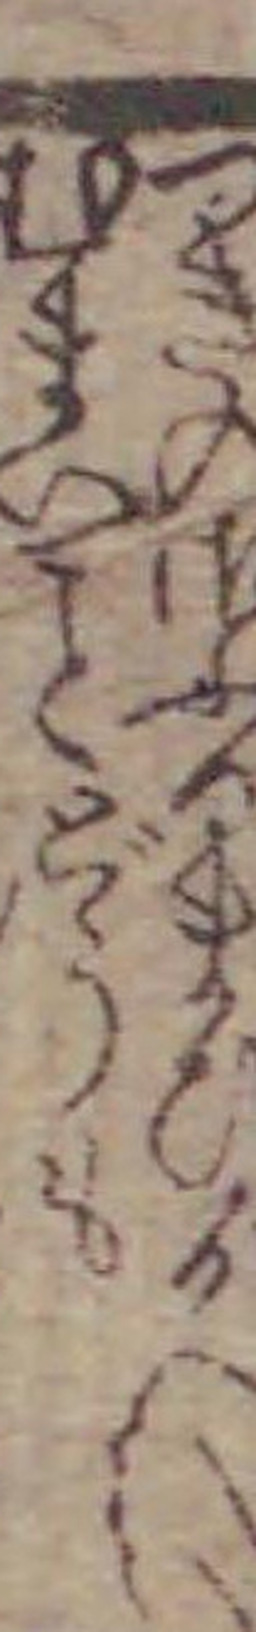むまいことどうも
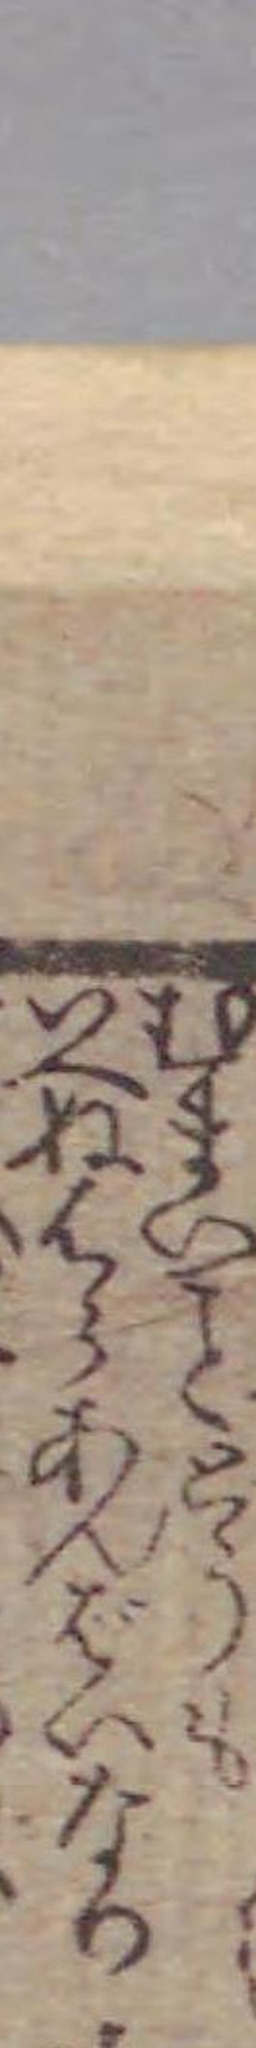いへぬはらあんばいなり
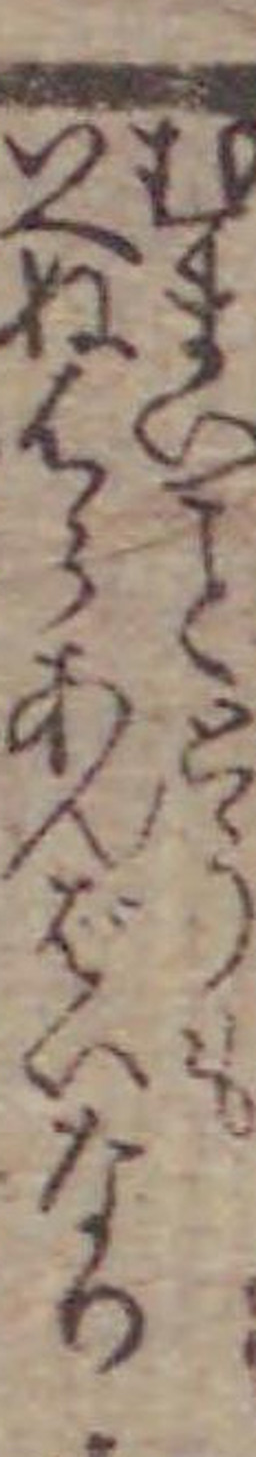いへぬはらあんばいなり
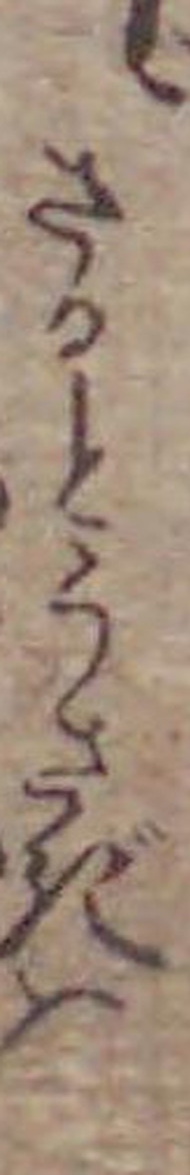さるとうさぎは
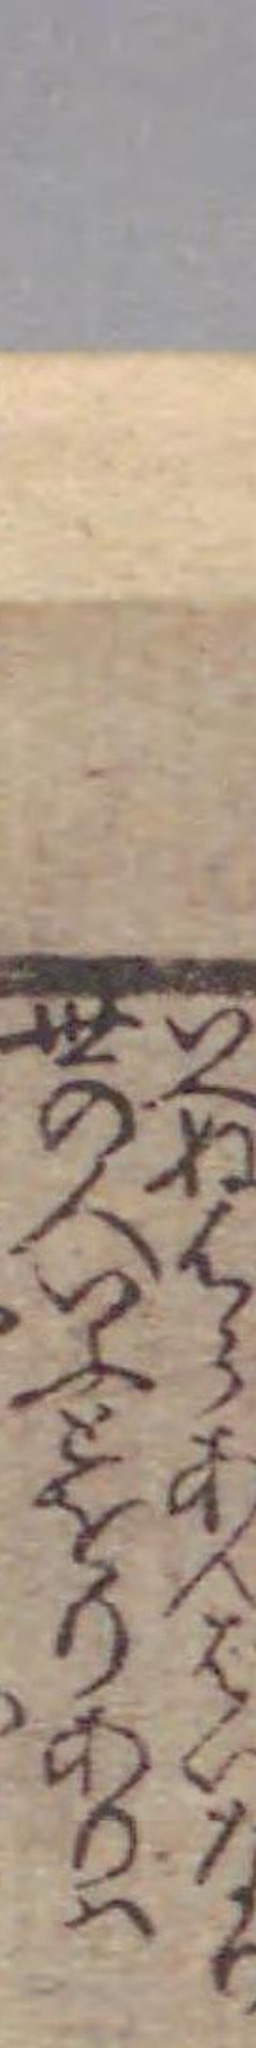世の人いふとをりありは
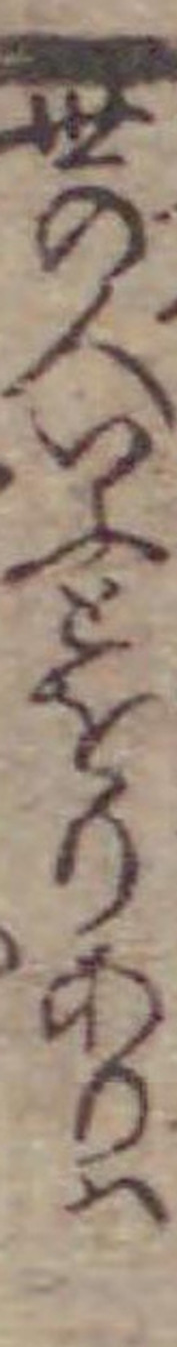世の人いふとをりありは
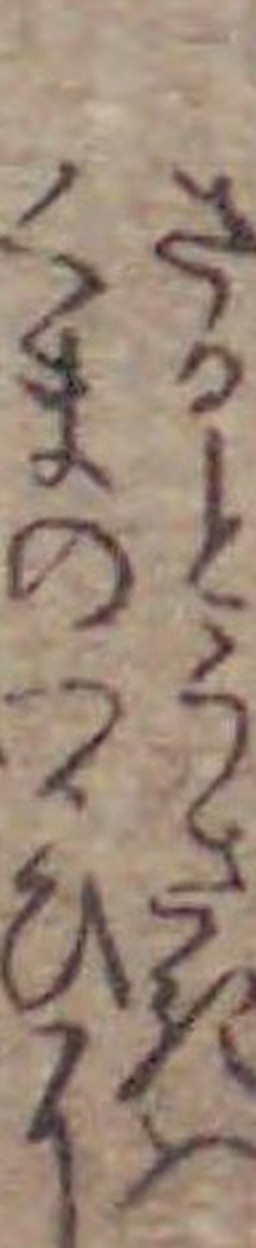くまのつかひに
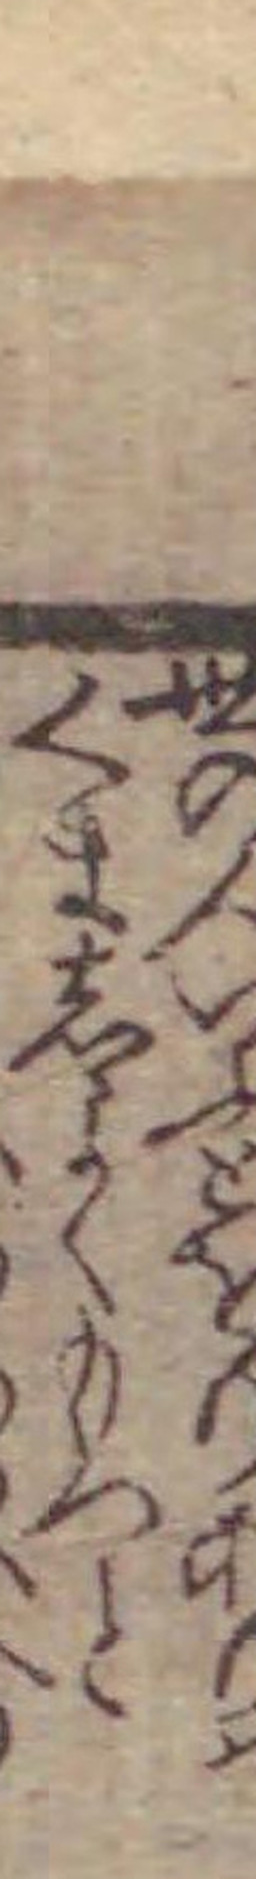くましよくもつと
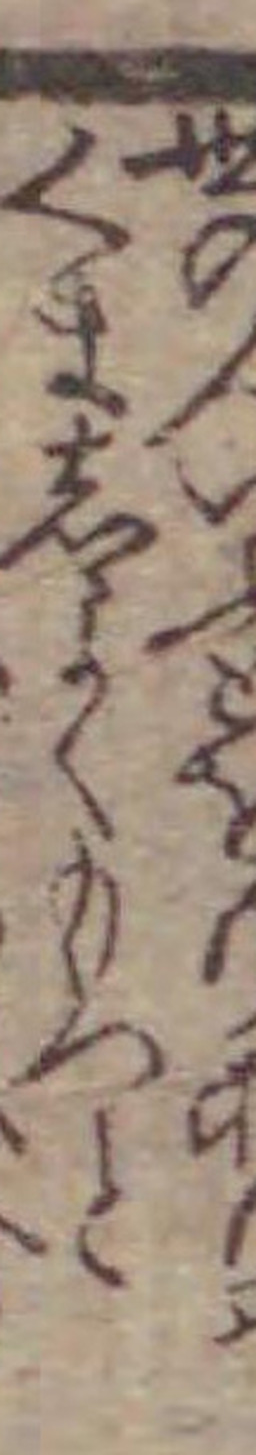くましよくもつと
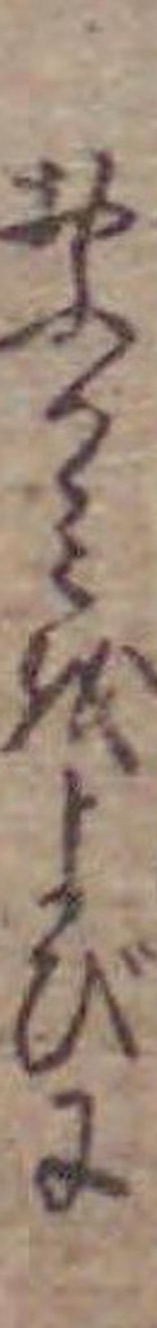おふかみをよびに
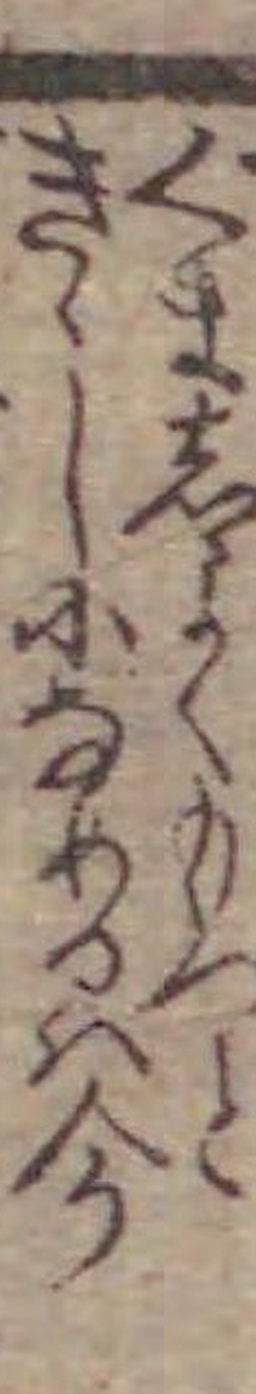きゝしになめるは今
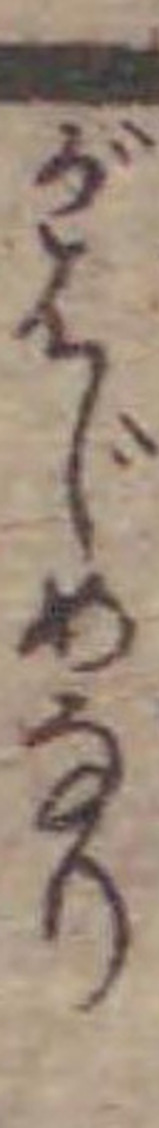がはじめなり

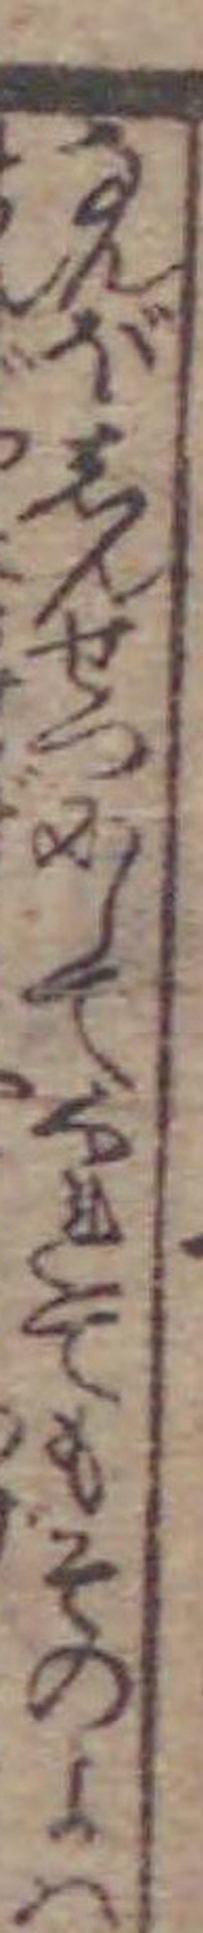なんぼしんせつにしてくれてもそのよは
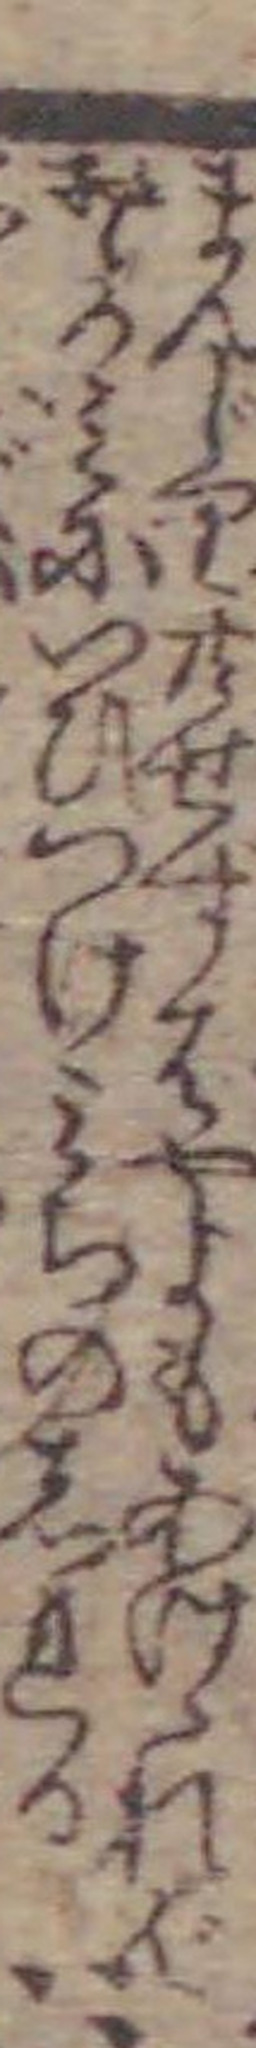おゝかみにいひつけみちのしれる
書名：即席耳学問 : 3巻
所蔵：国立国会図書館 National Diet Library, JAPAN
